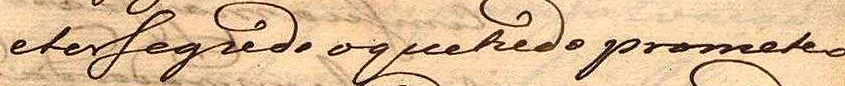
e ter segredo o que tudo prometeo
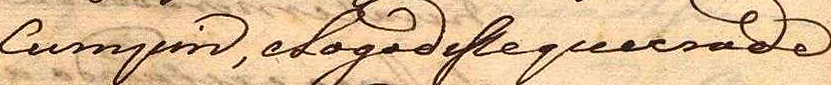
Cumprir, e Logo disse que era de
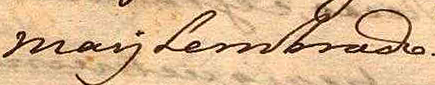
mais Lembrado.
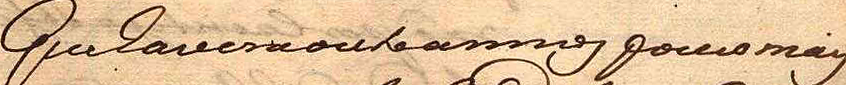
Que havera outo annos pouco mais
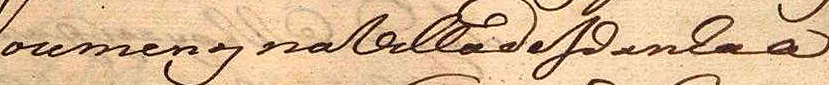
ou menos na Villa de Jdanha a
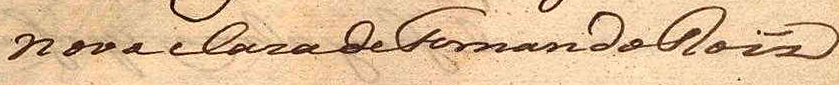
nova e Caza de Fernando Roiz̄
